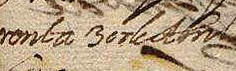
renta 30 de Abril
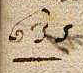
635
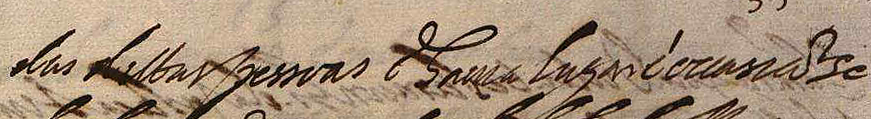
das dittas pessoas, e hauia lugar e ocasião se
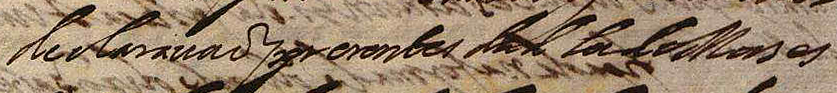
declarauaõ por crentes da d Lei de Moises
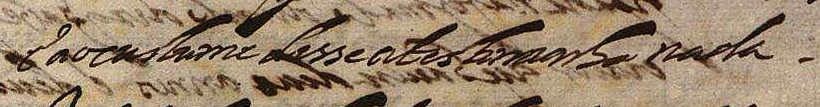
E ao custume disse a testimunha nada.
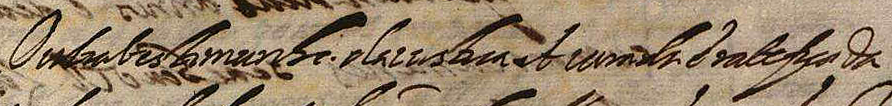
Outra testimunha da iustiça A iurada e rateficada
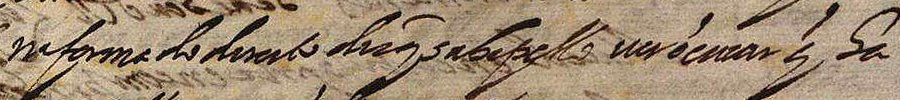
na forma do direito dis q̄ sabe pello uer e cuzar q̄ ha
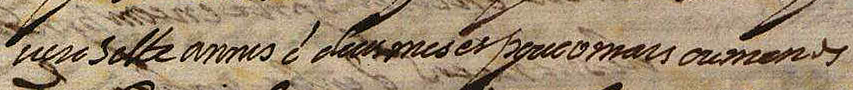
uera sette annos e dous meses pouco mais ou menos
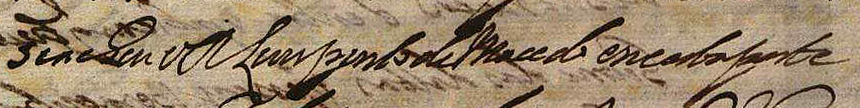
se achou o R Luis pinto de Macedo en cada parte
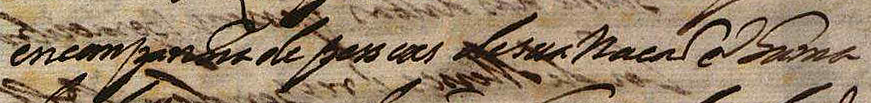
en companhia de pessoas de sua Naçaõ e huma
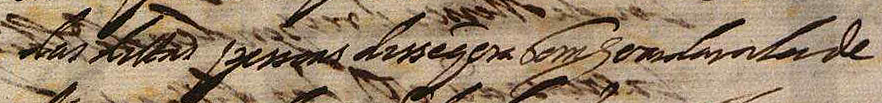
das dittas pessoas disse q̄ era bom goardar a Lei de
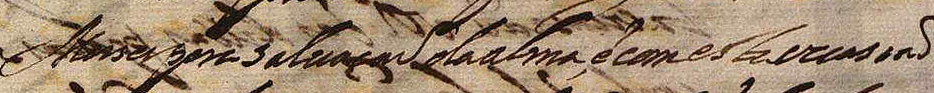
Moizes pera saluaçaõ da alma, e com esta occasiaõ
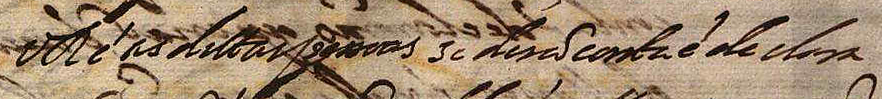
o R e as dittas pessoas se deraõ conta e declara
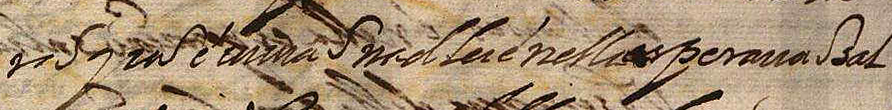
raõ q iaõ e uiuiaõ na d lei e nella esperauaõ sal
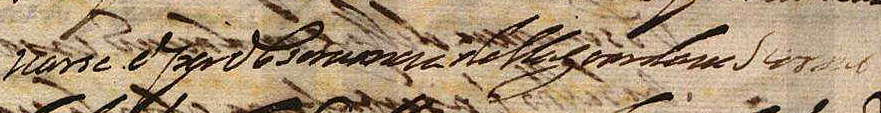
uarse e por obseruancia della goardauaõ os sab
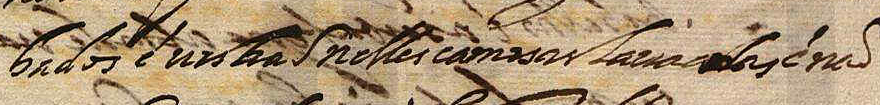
bados e uestiaõ nelles camisas lauadas e naõ
